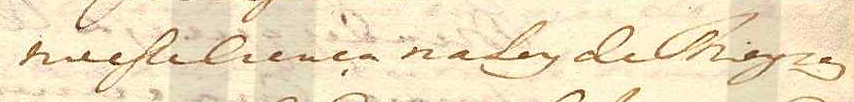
tiuesse crença na Ley de Moyzes
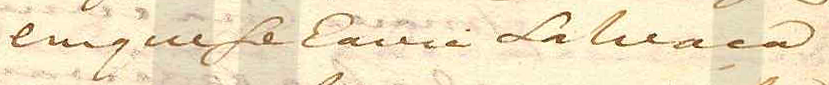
em que se havia salvaçā
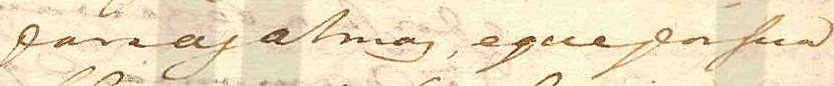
para as almas, e que por sua
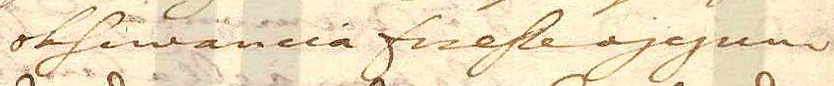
observancia fizesse o jejum
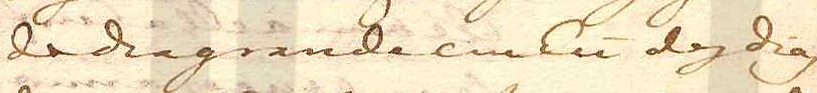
do dia grande em hū dos dias
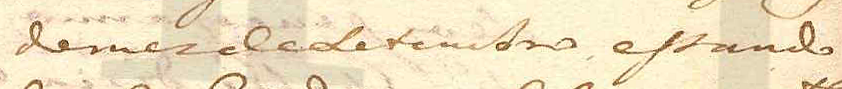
do mez de setembro, estando
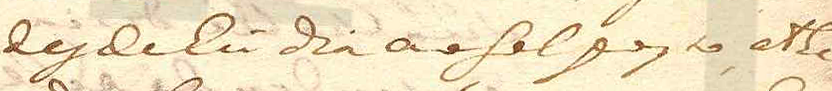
desde hū dia ao sol posto, athe
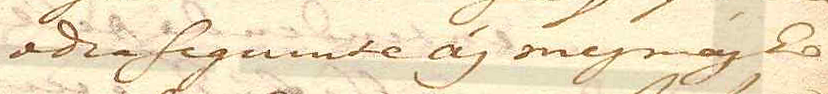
o dia seguinte ás mesmas ho
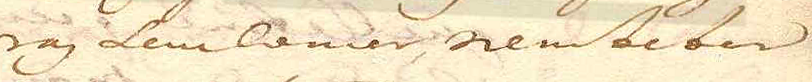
ras sem comer, nem beber
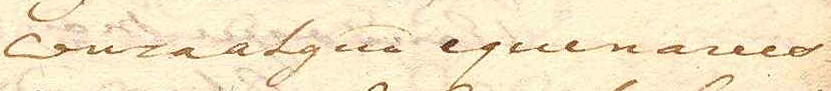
couza alguā e que na ves
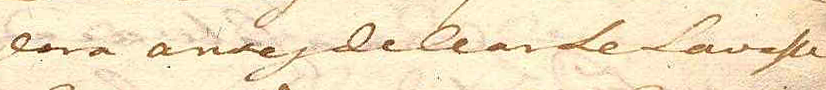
pora antes de cearse Lavasse
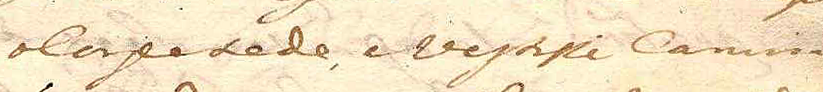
o Corpo todo, e vestisse camiza
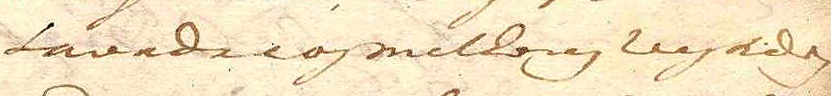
lavada e os melhores vestidos
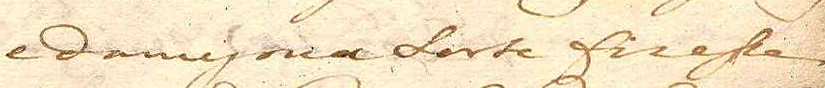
e da mesma sorte fizesse
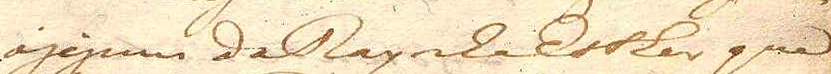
o jejum da Raynha Esther que
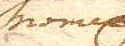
no mez
